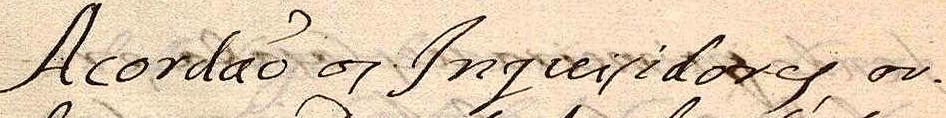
Acordaõ os Jnquisidores, or
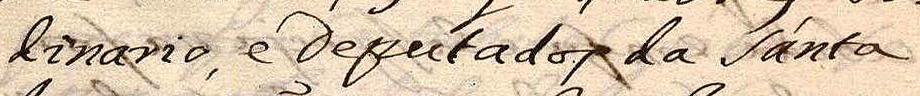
dinario, e deputados da santa
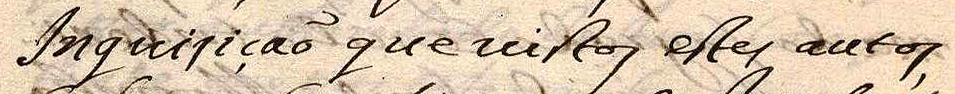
Inquisiçaõ que uistos estes autos,
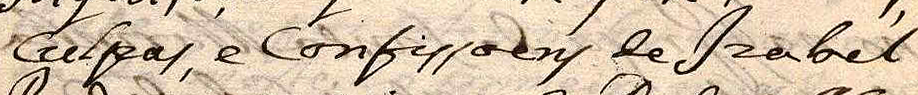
Culpas, e confissoens de Jzabel
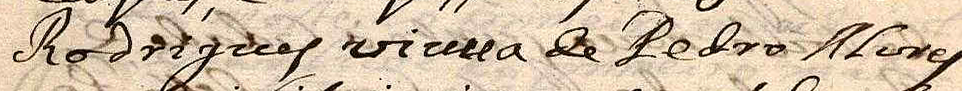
Rodrigues viuua de Pedro Alvres
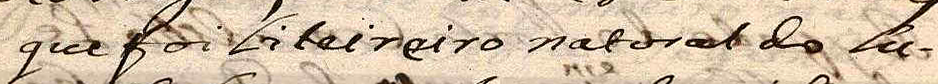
que foi liteireiro natural do lu
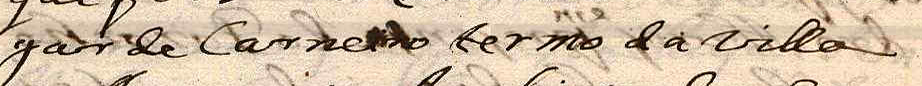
gar de Carneiro termo da villa
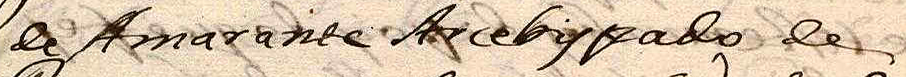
de Amarante Arcebispado de
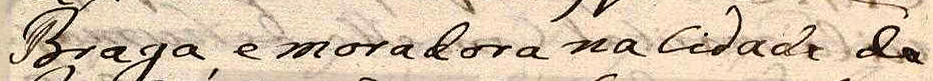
Braga, e moradora na Cidade de
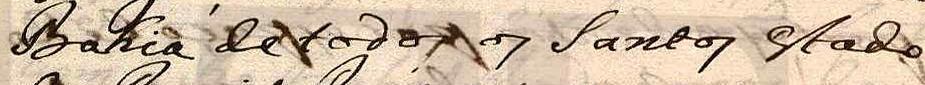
Bahia de todos os Santos estado
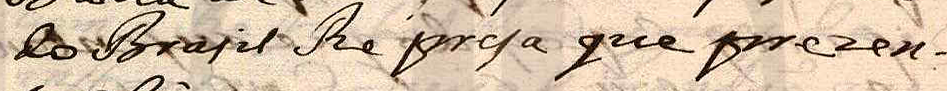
do Brasil Re presa que prezen
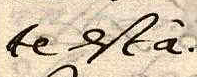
te está.
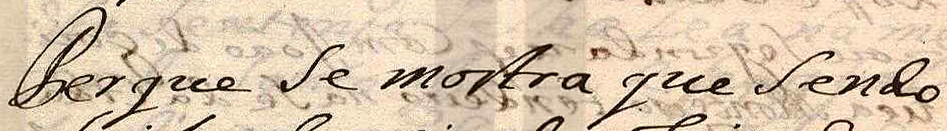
Perque se mostra que sendo
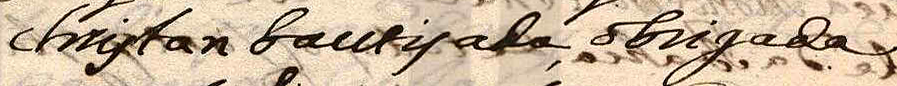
christan bautisada, obrigada
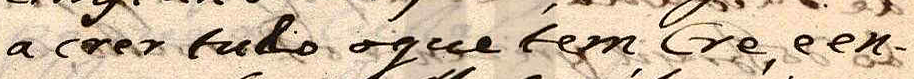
a crer tudo o que tem, cre, e en
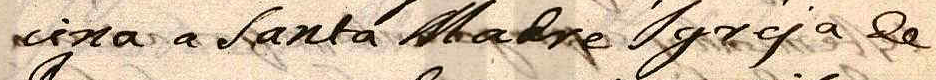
cina a Santa Madre Igreja de
